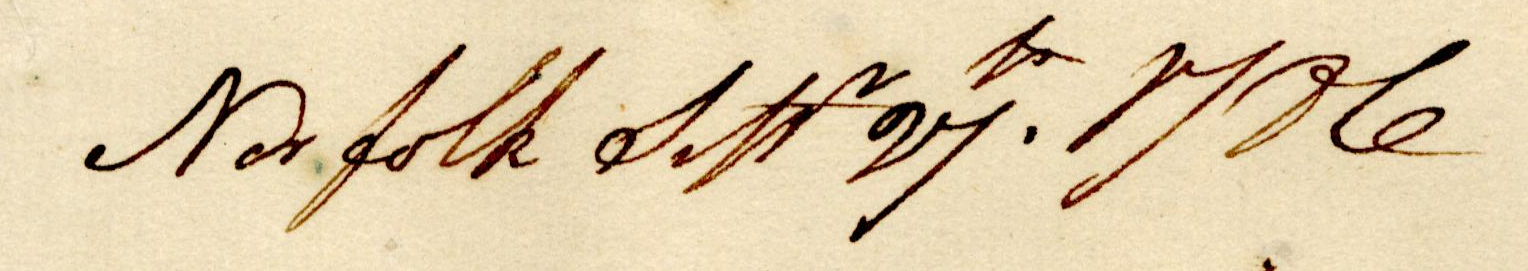Norfolk Sept^r 27^th. 1776
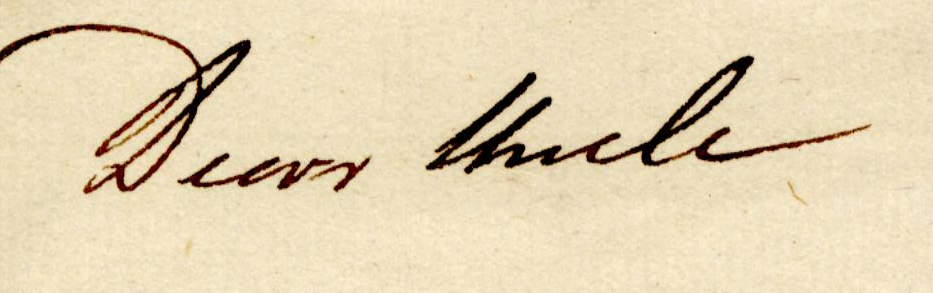Dear Uncle
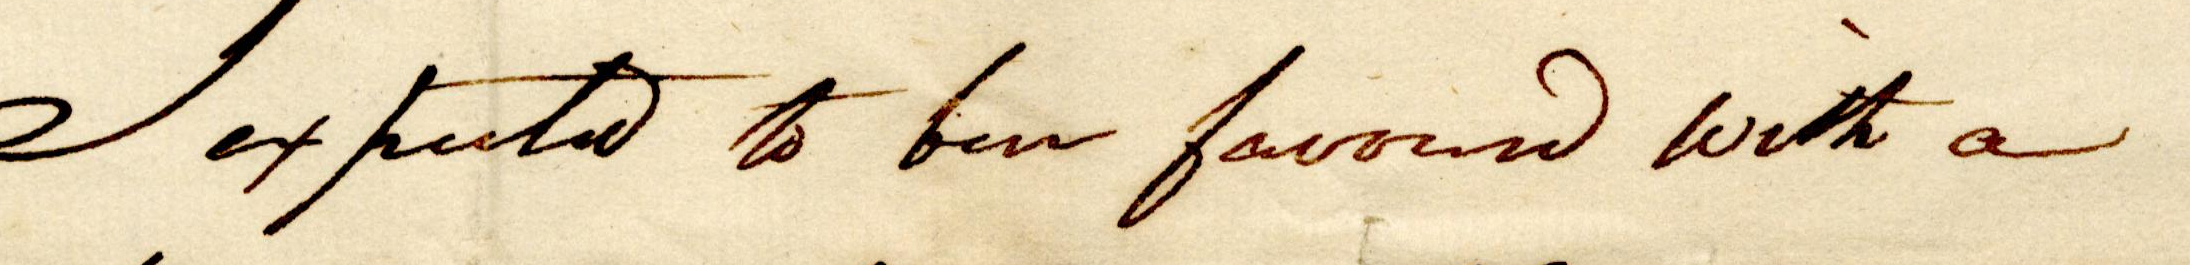I expected to ben favourd with a
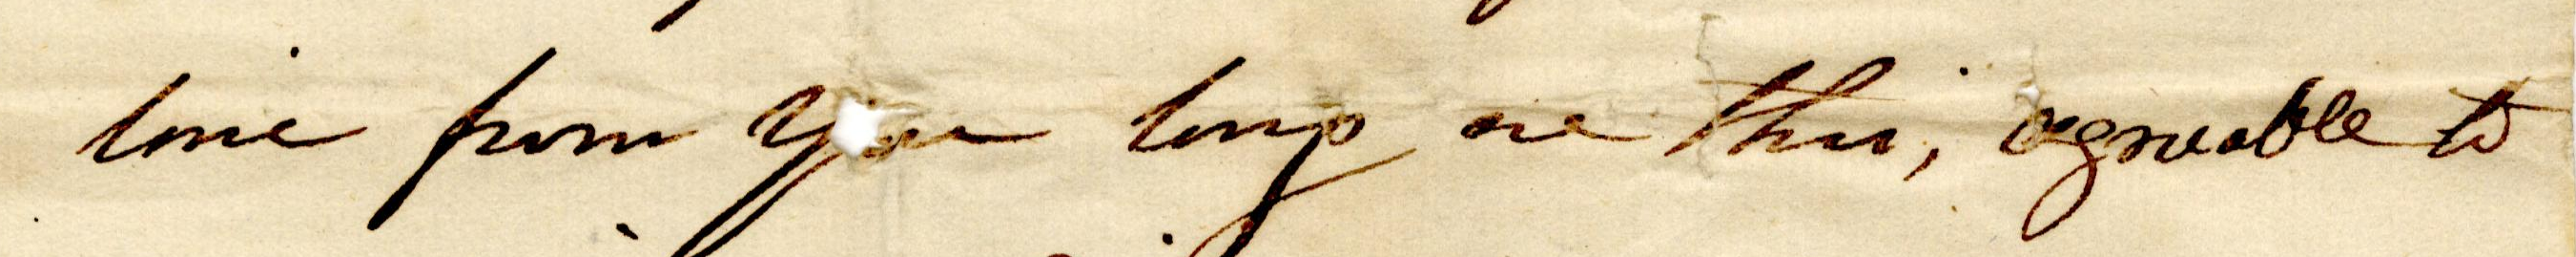line from you long as this, agreable to
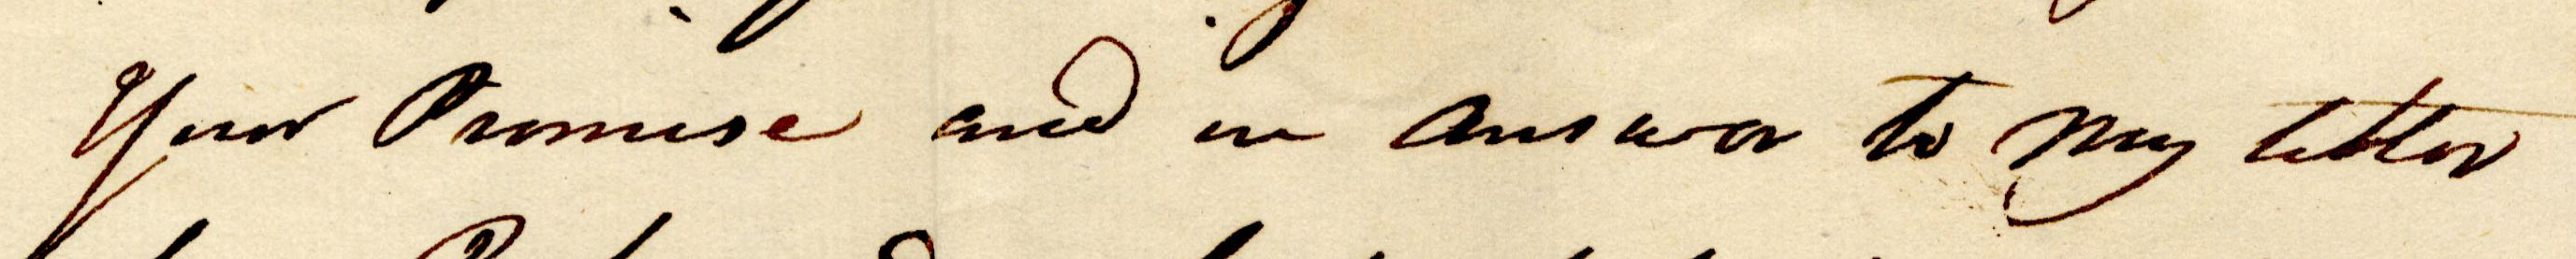your Promise and in answer to my letter
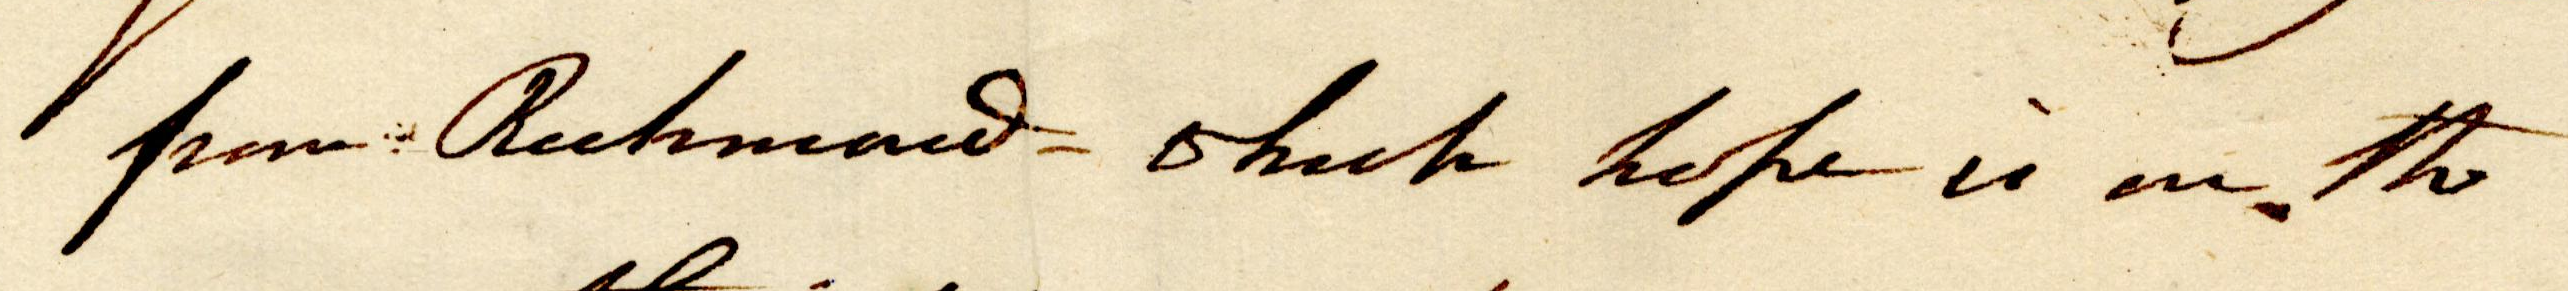from Richmond- which hope is on the
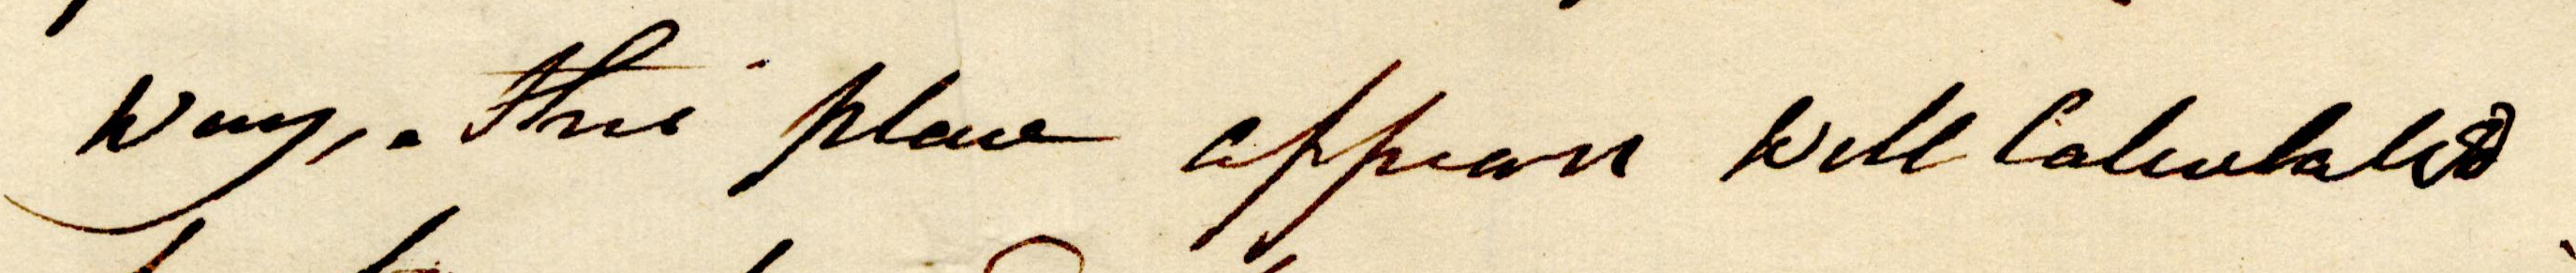way, This place appears well Calculated
